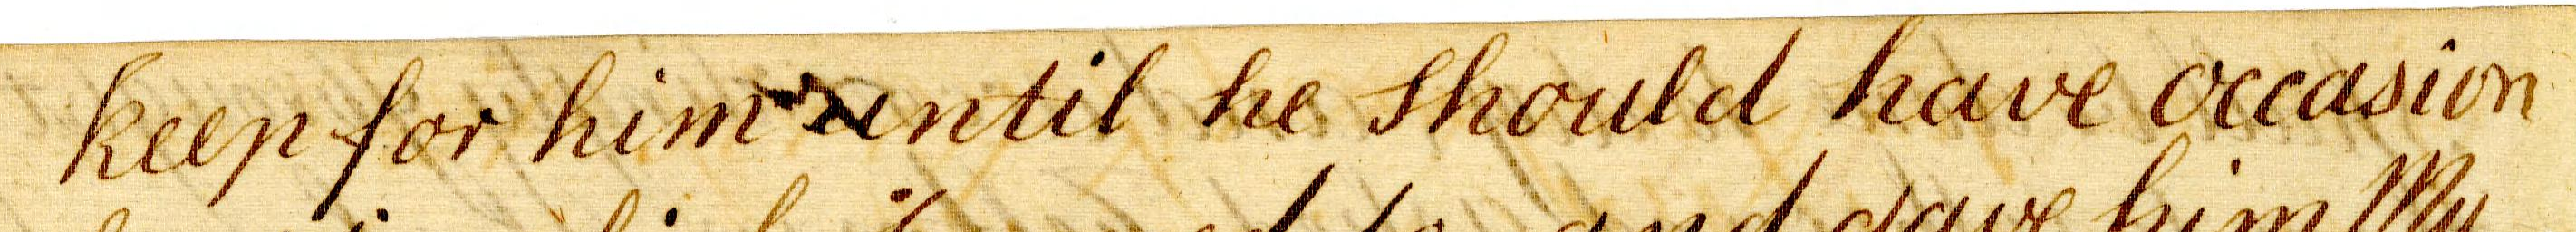keep for him until he should have occasion
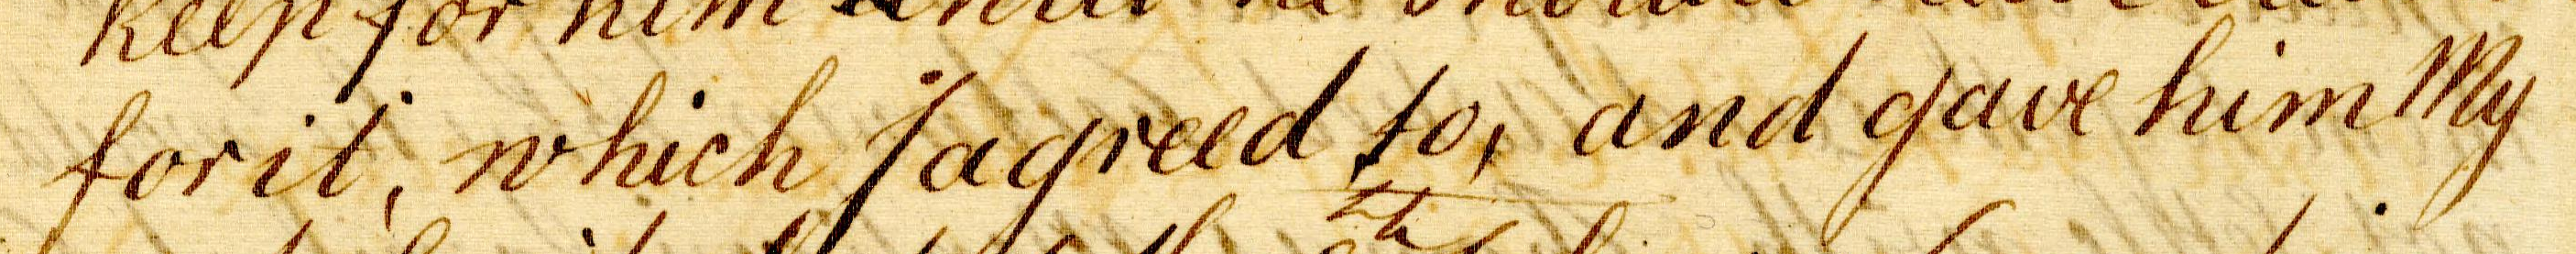for it; which I agreed to, and gave him My
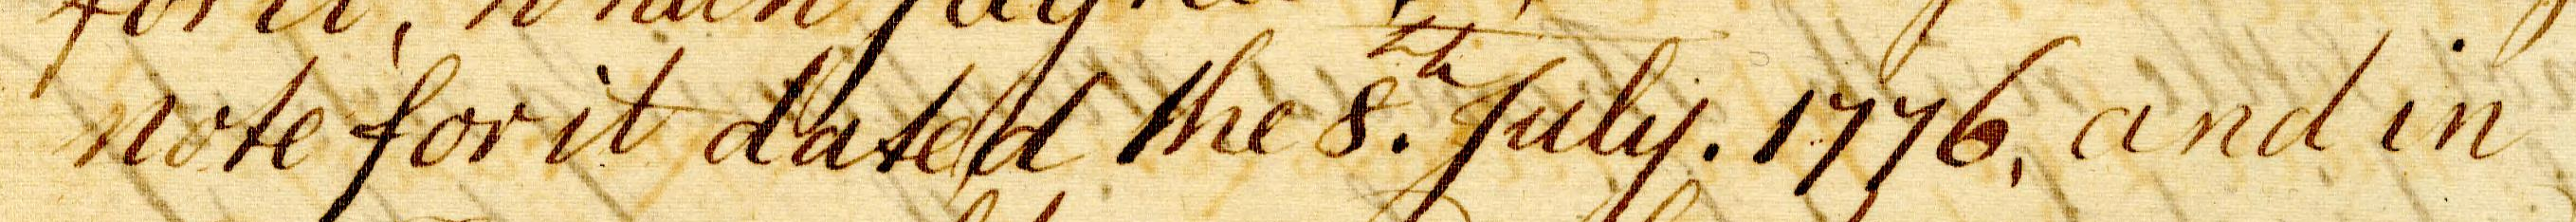note for it dated the 8^th. July. 1776, and in
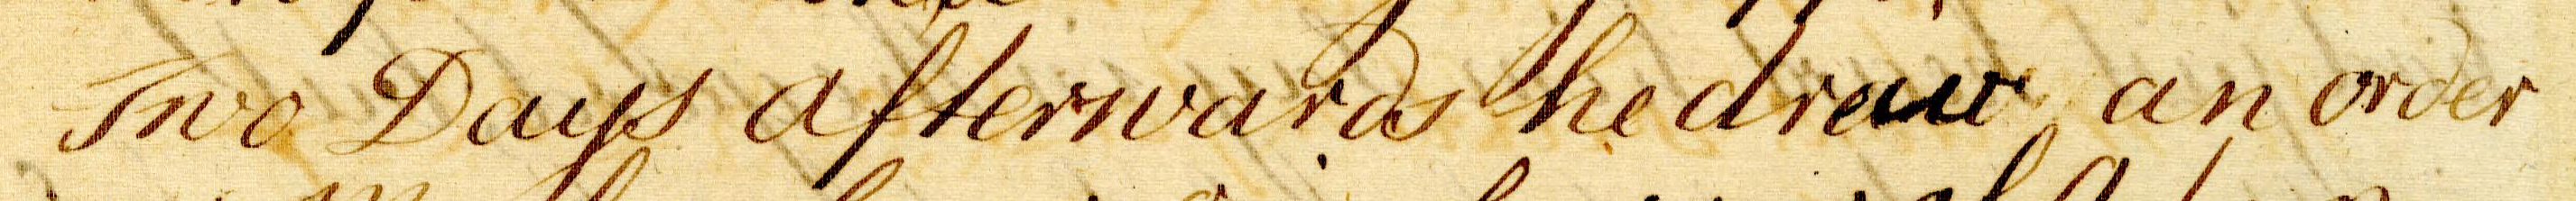Two Days afterwards he drew an order
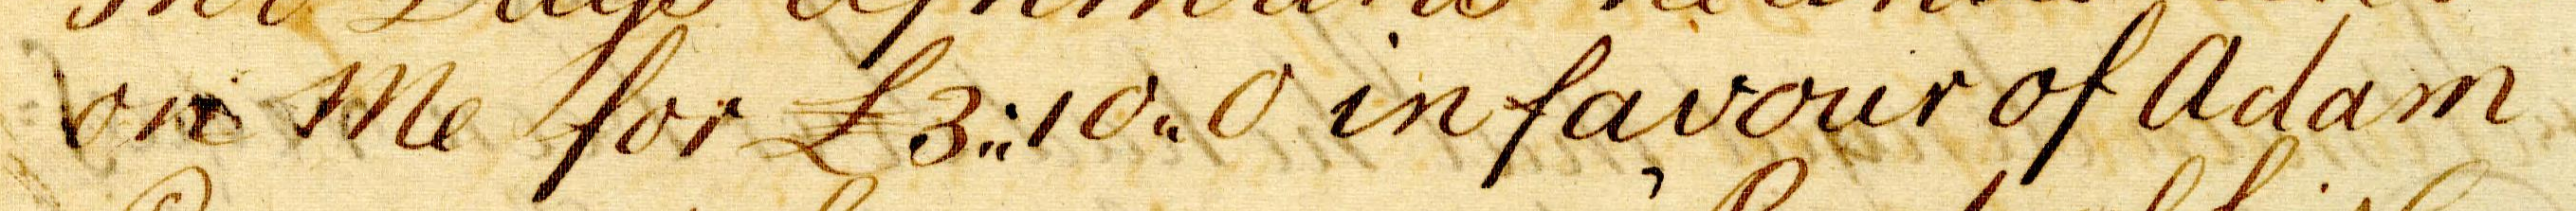on Me for £3:.10..0 in favour of Adam
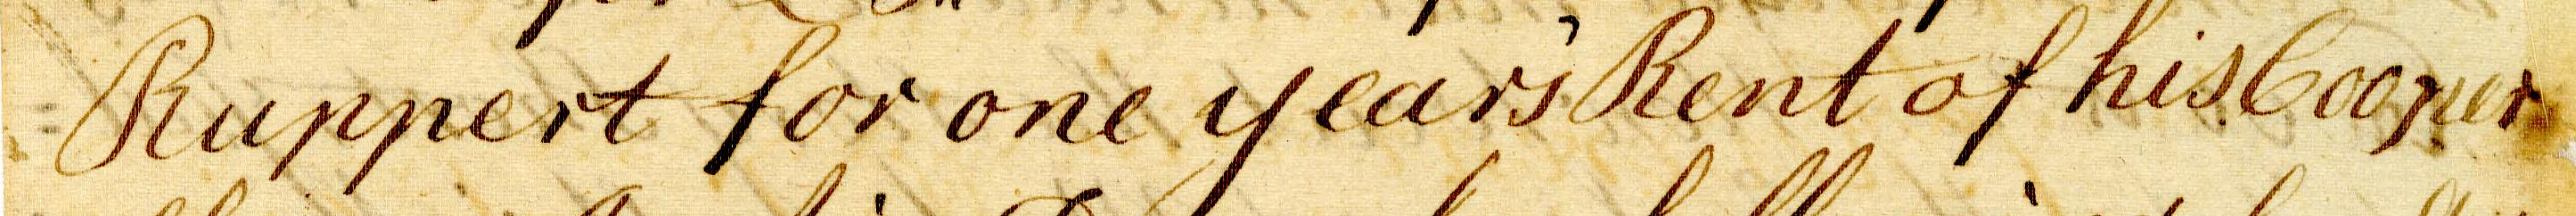Ruppert for one years' Rent of his Cooper
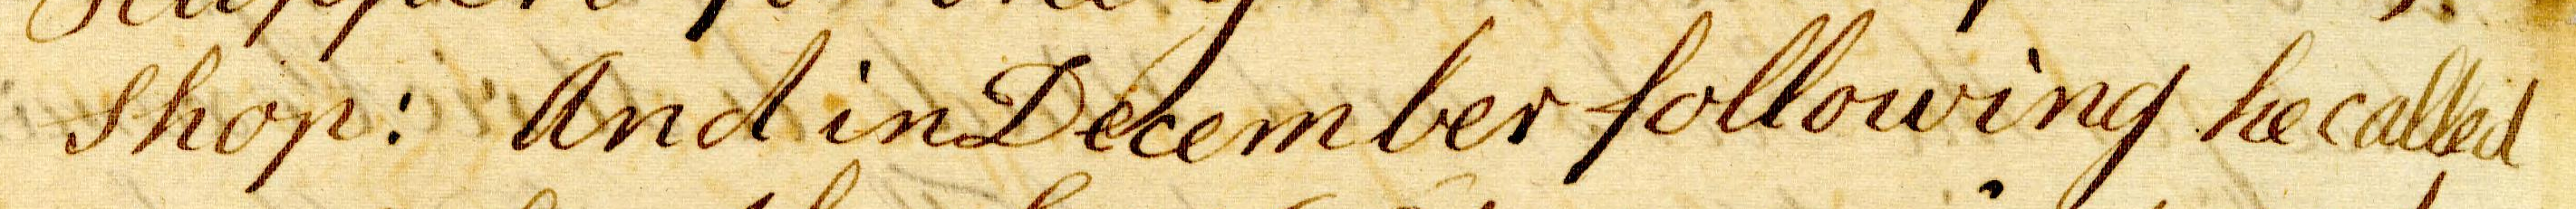shop: And in December following he called
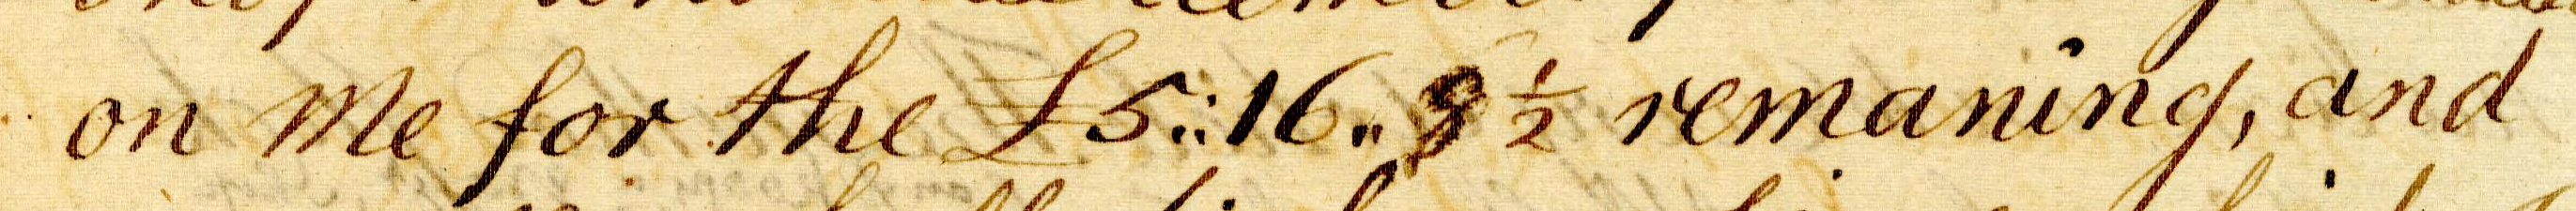on Me for the £5:.16..8 1/2 remaining, and
